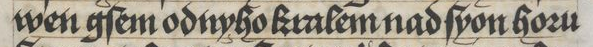wen gſem odnyho kralem nad ſyon horu¬
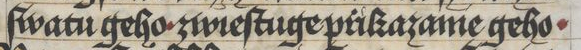ſwatu geho.zqieſtuge pṙikazanie geho.
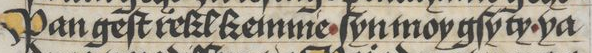Pan geſt ṙekl kemnie.ſyn moy gſy ty.ya
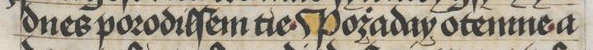dnes porodilſem tie.Pożaday otemne.a
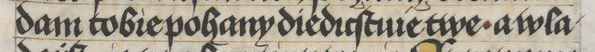dam tobie pohany diedicſtvíe twe.a wla¬
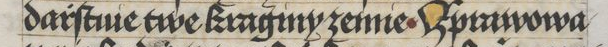daṙſtvie twe kraginy zemie.Zprawowa¬
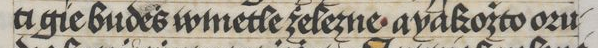ti gie budeṡ w metle żelezne.a yakożto ozu¬
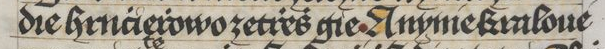die hrnċieṙowo zetṙeṡ gie.A nynie kralové
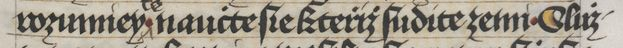rozumieyte.nauċte ſie kteṙiż ſudite zemi.Sluż¬
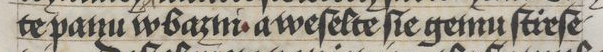te panu w bazni.a weſelte ſie gemu ſtṙeſe¬
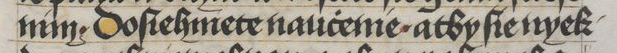nim.Doſiehniete nauċenie.atby ſie nyek¬
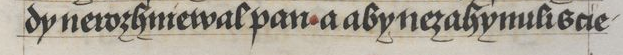dy nerozhniewal pan.a aby nezahynuli s cie¬
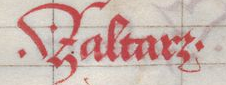.Żaltarz.
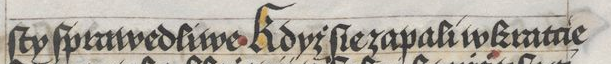ſty ſprawedliwe.Kdyż ſie zapalí w kratcie
